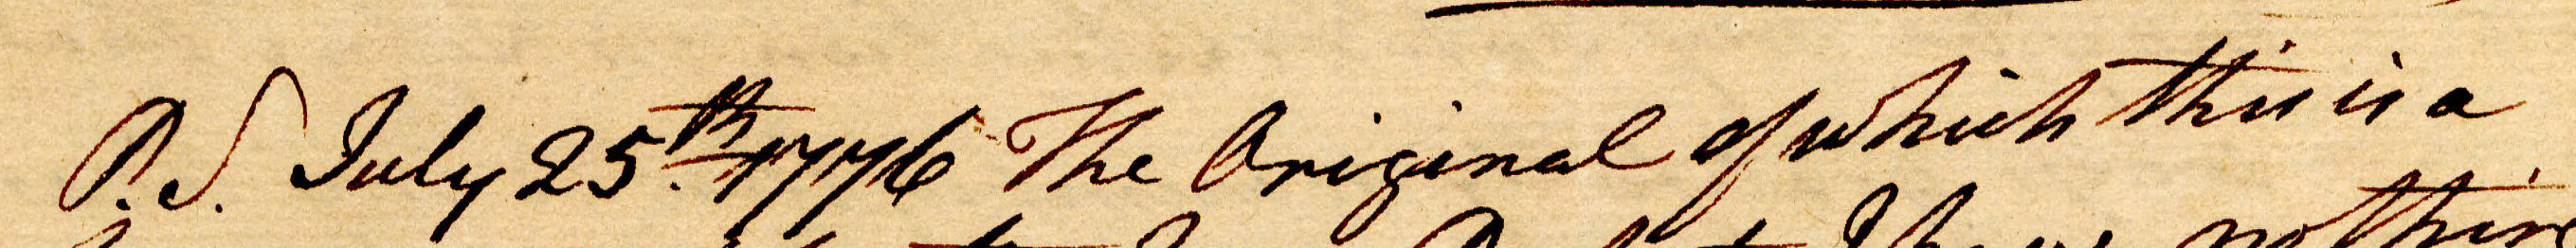P.S. July 25^th 1776 The Original of which this is a
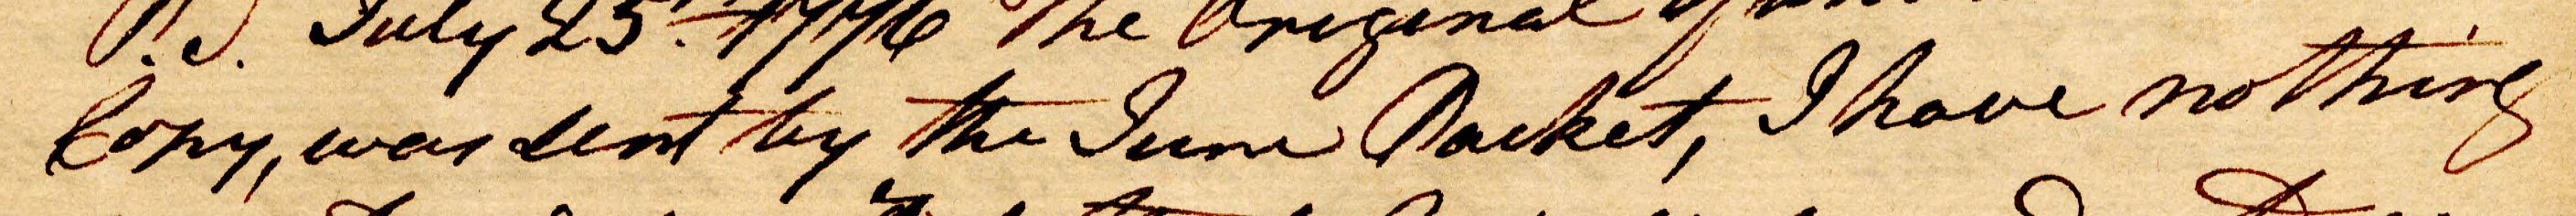Copy, was sent by the June Packet, I have nothing
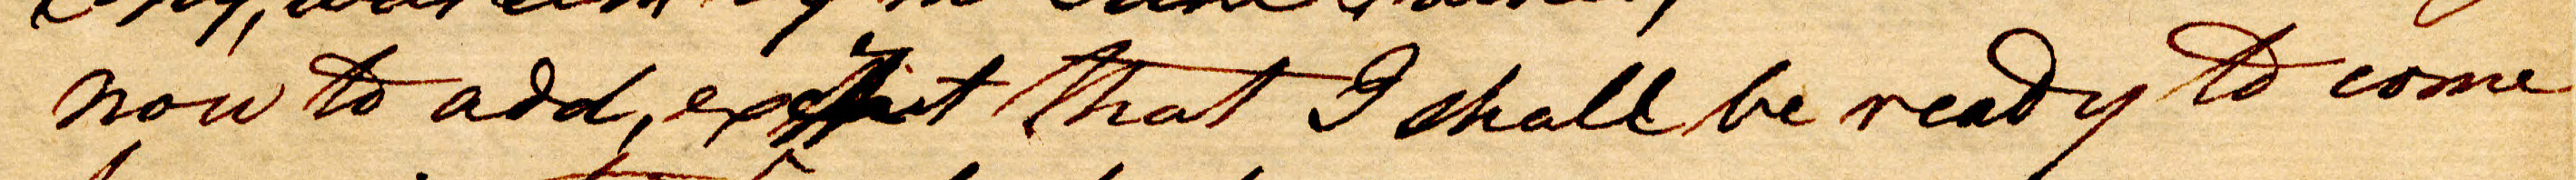now to add, except that I shall by ready to come
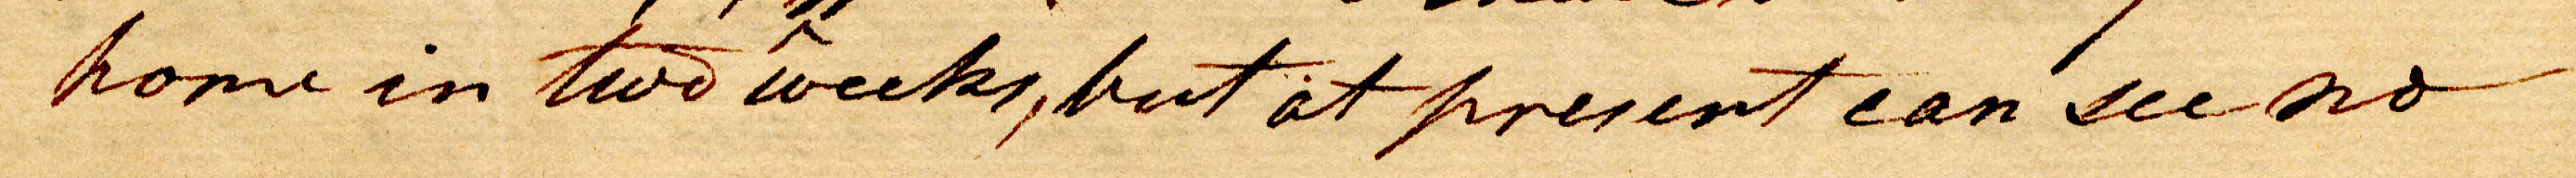home in two weeks, but at present can see no
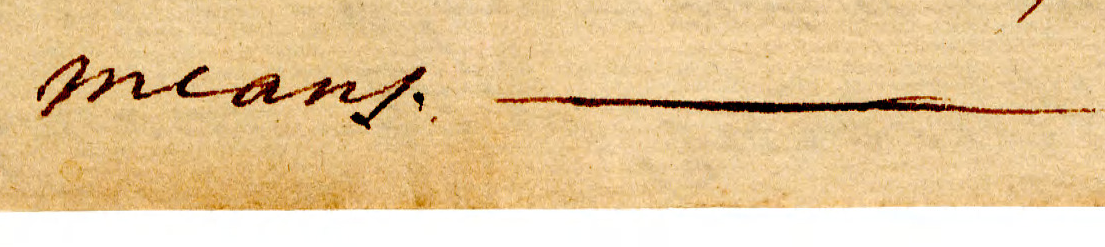means.-
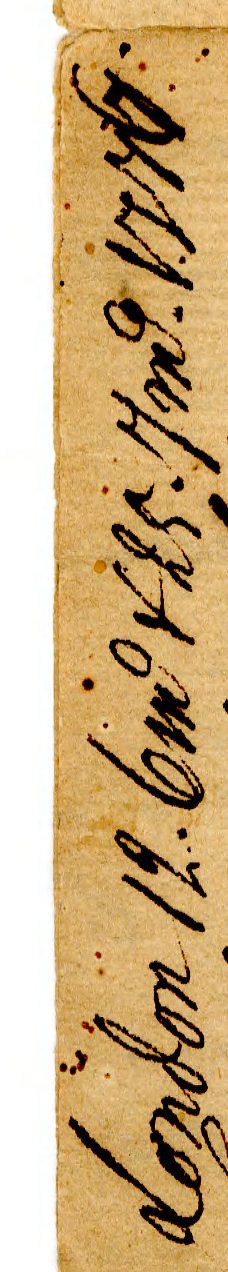London 12. 6m^o & 25. 7m^o 1776
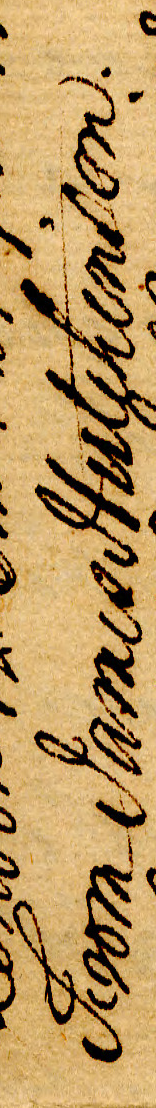From James Hutchinson
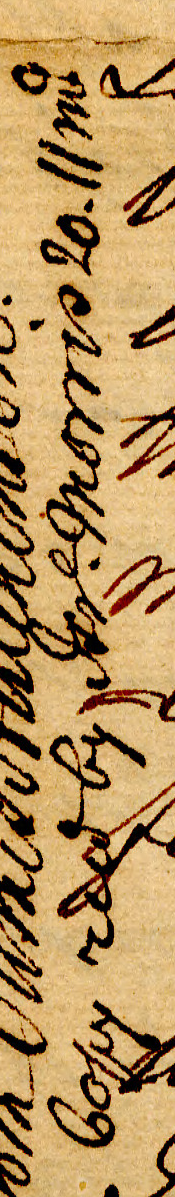Copy recd by Isr^l Morris 20.11 m^o
